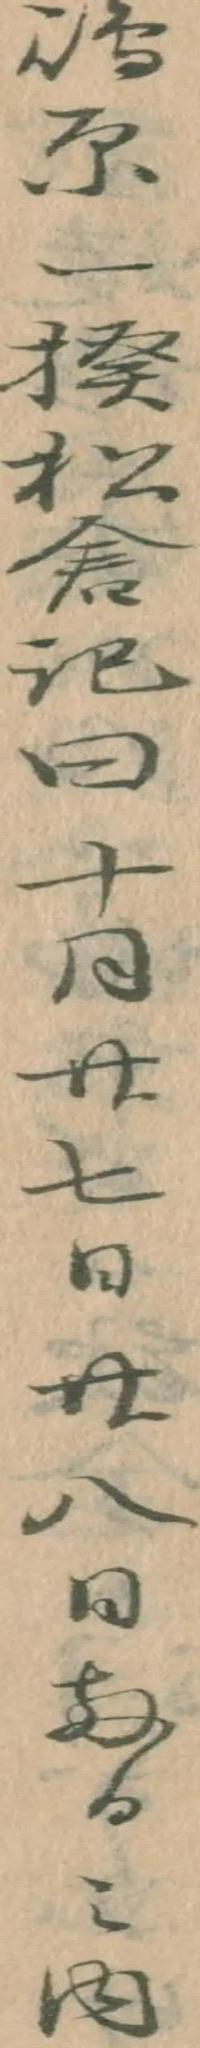島原一揆松倉記曰十月廿七日廿八日両日之内
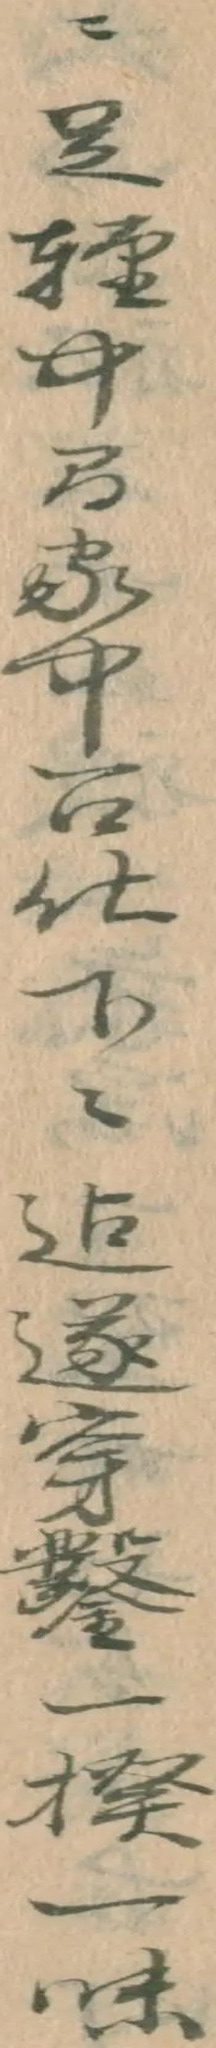に足軽中間家中召仕下々迄遂穿鑿一揆一味
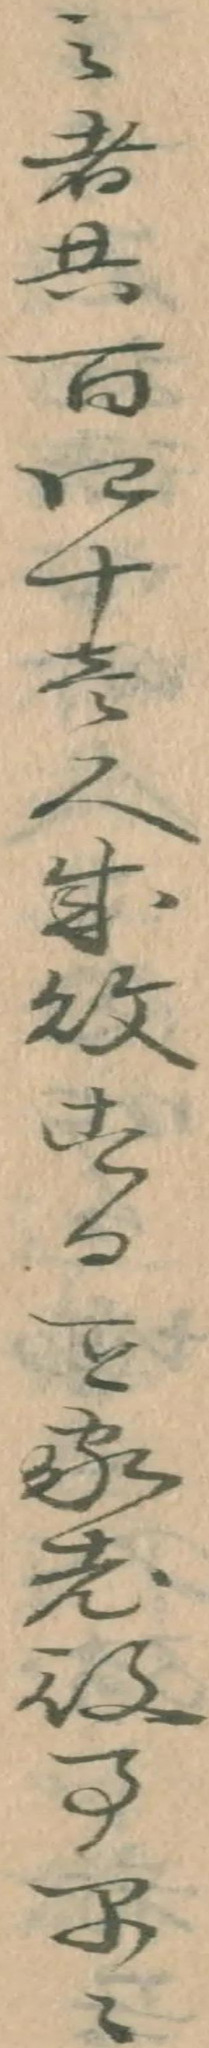之者共百四十壱人成敗春ると家老役事早々
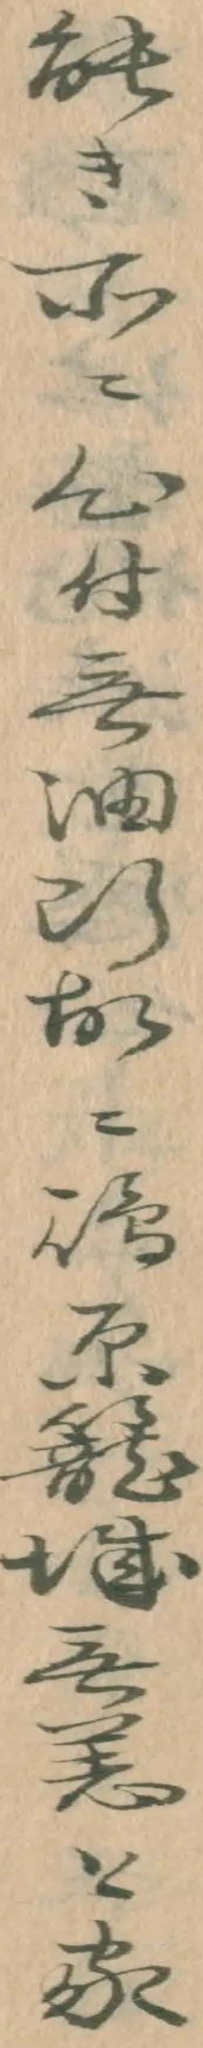能き所に心付無油断故に島原籠城無恙と家

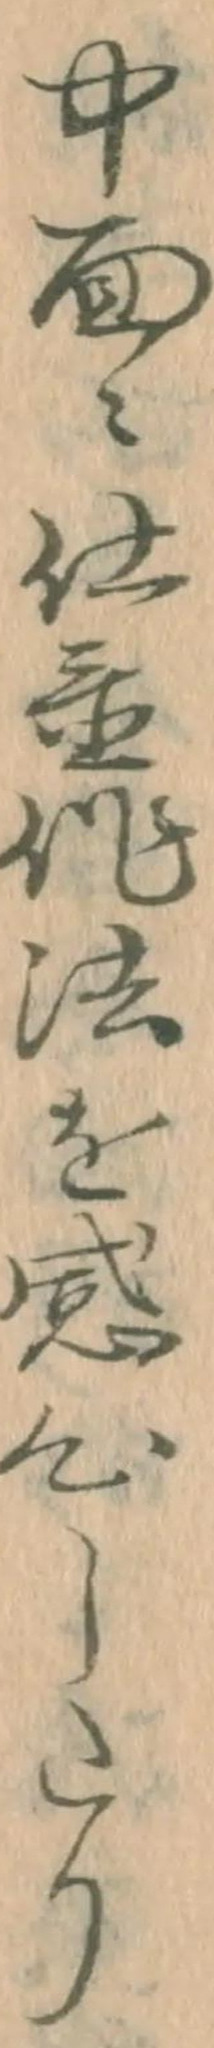中面に仕置作法を感心したり
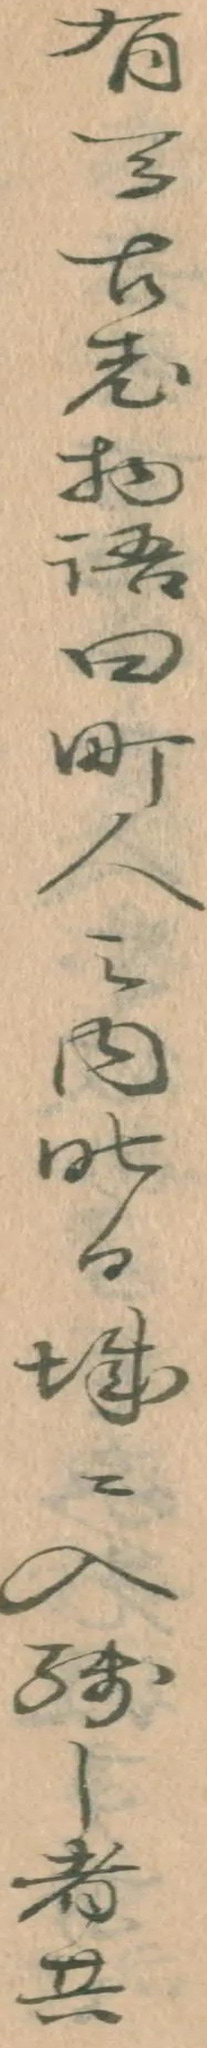有馬古老物語曰町人之内昨日城に入残し者共
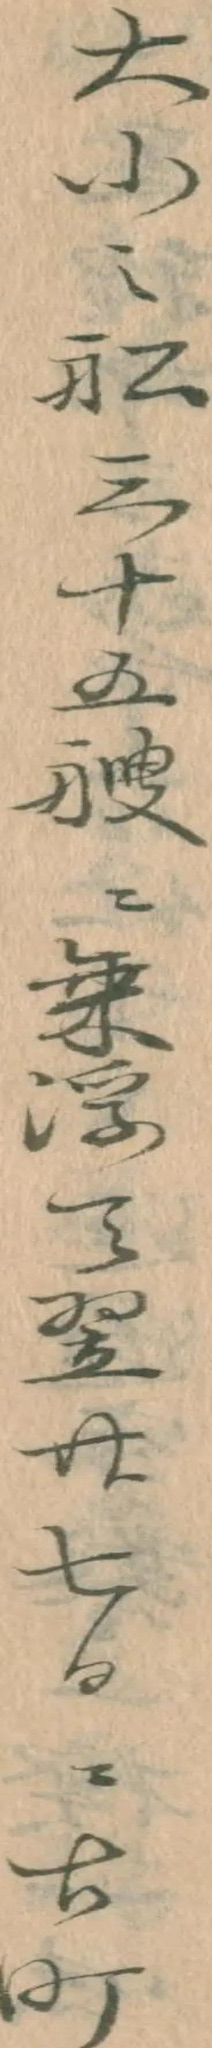大小之舩三十五艘に乗浮て翌廿七日に古町
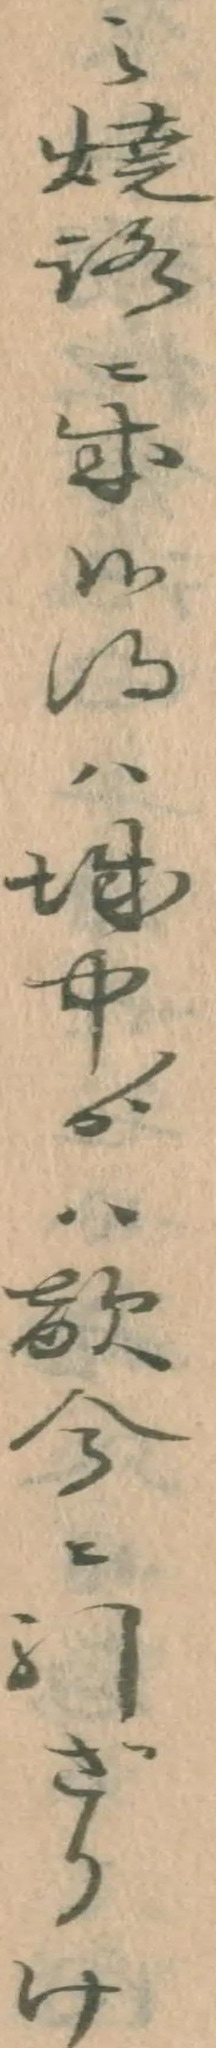之焼洛に成候得は城中ゟは敵今に引ざりけ
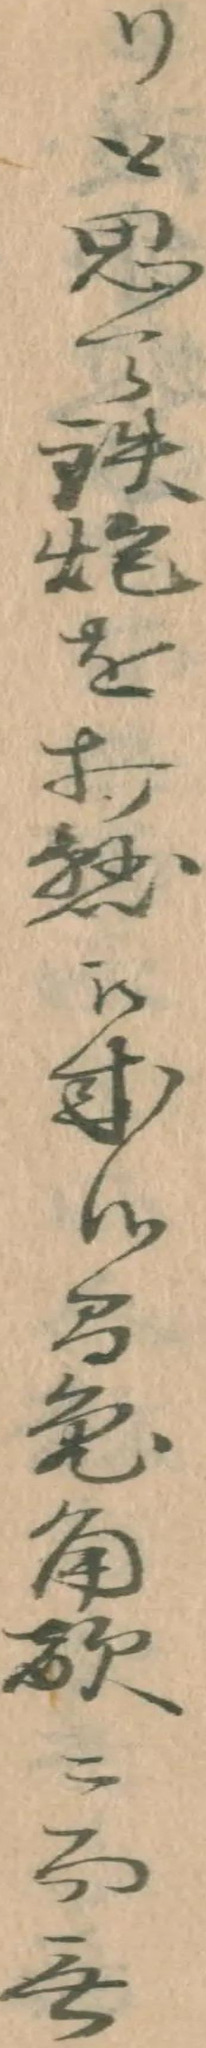りと思て鉄炮を打懸被成候間兎角敵に而無
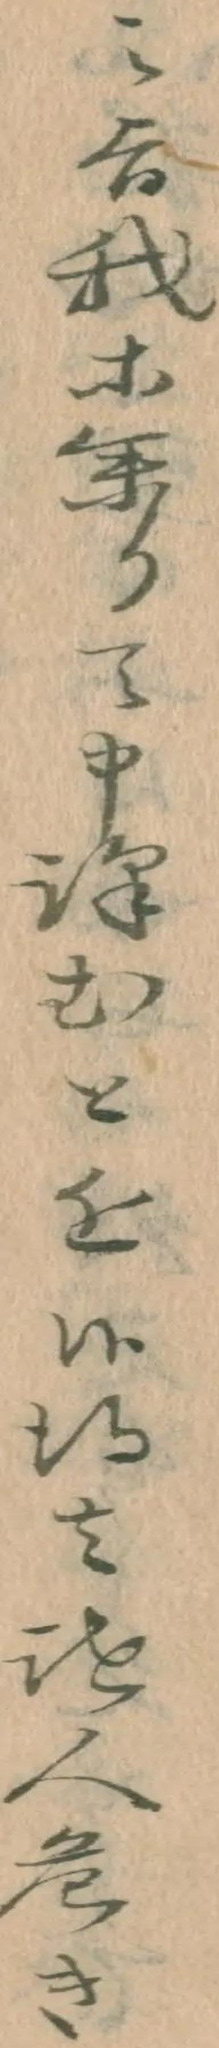之旨我等参りて申訳むと近候得は諸人危き
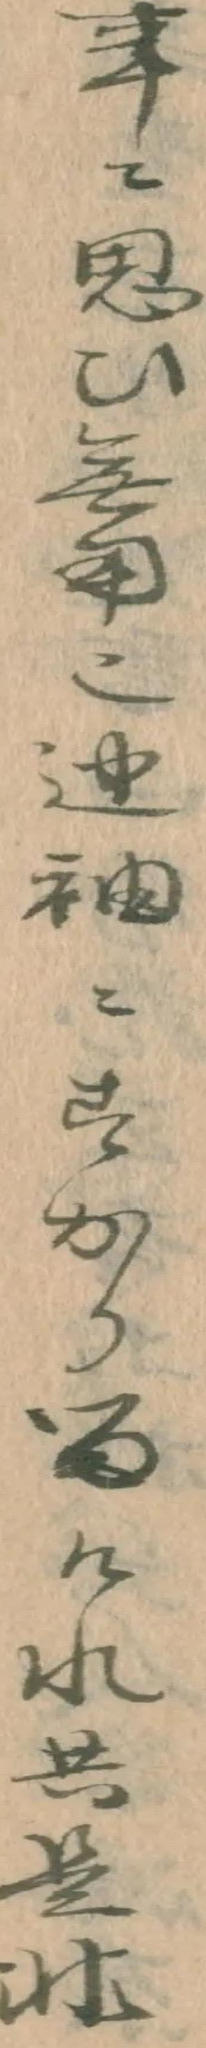事に思ひ無用也迚袖に春かり留けれ共是非
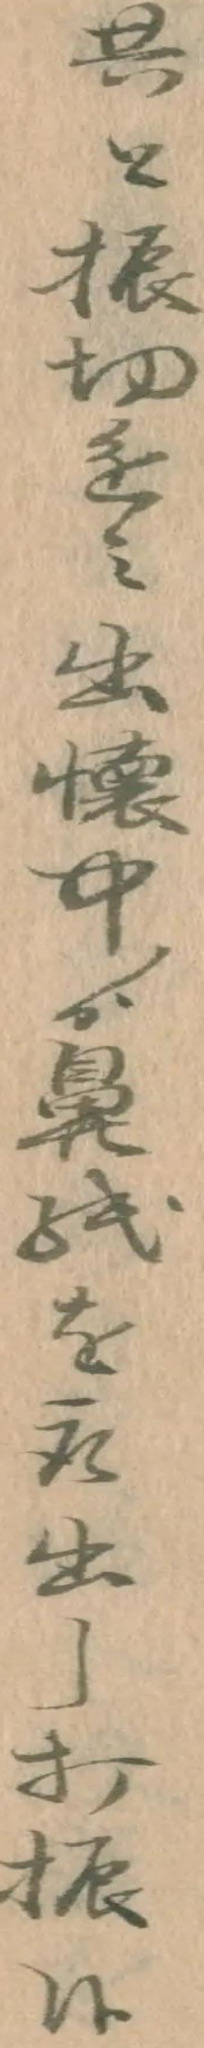共と振切進み出懐中ゟ鼻紙を取出し打振候
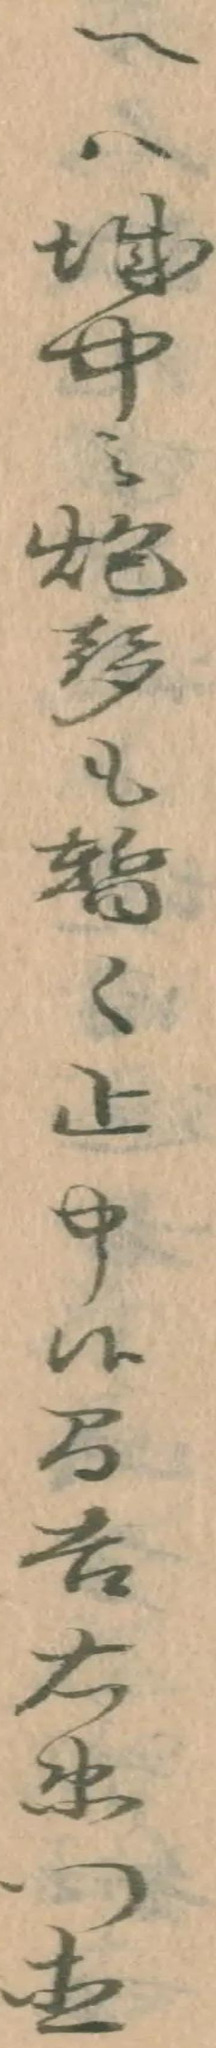へは城中之炮声も暫く止申候間吉右衛門直
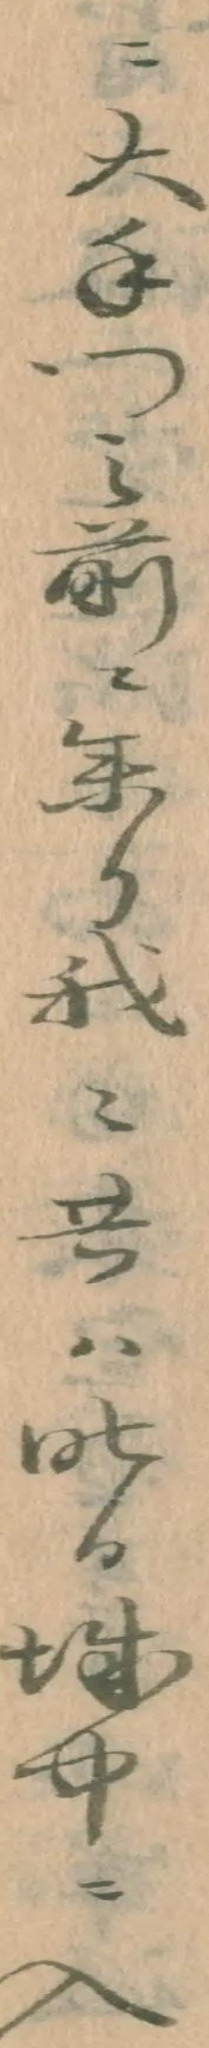に大手門之前に参り我々共は昨日城中に入
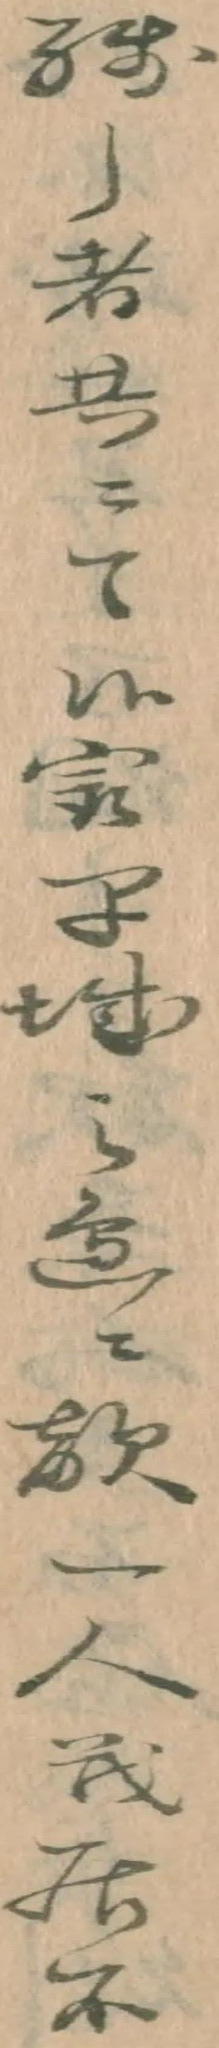残し者共にて候最早城之辺に敵一人茂居不
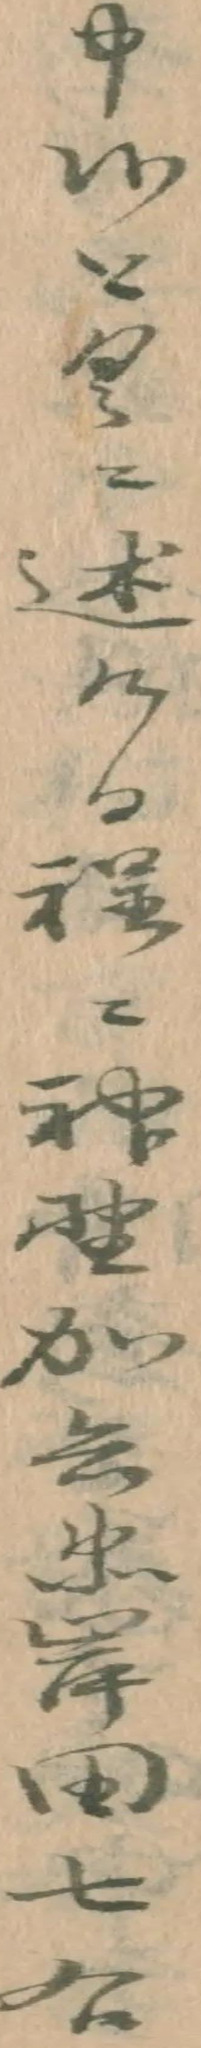申候と具に述ける程に神野加兵衛岸田七右
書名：切支丹御退治記 49巻. [2]
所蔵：国立国会図書館 National Diet Library, JAPAN
